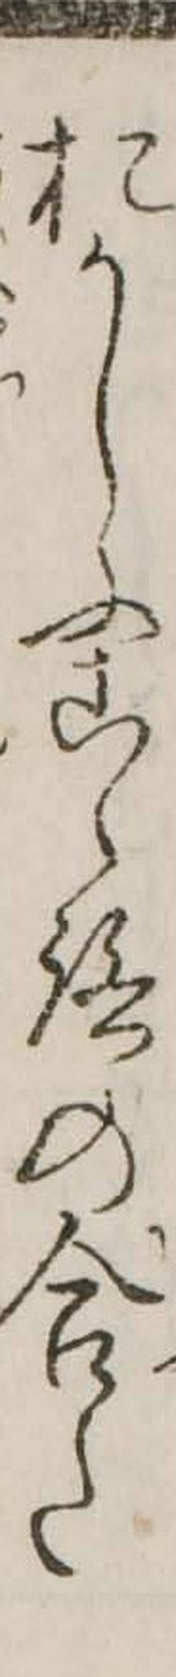おかしふこゝろの合た
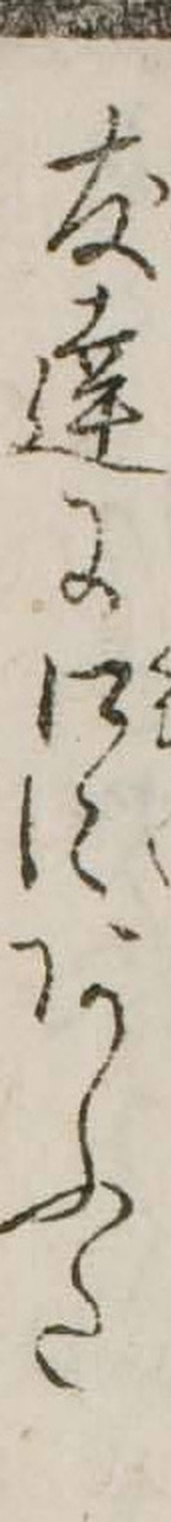友達に口々あふた
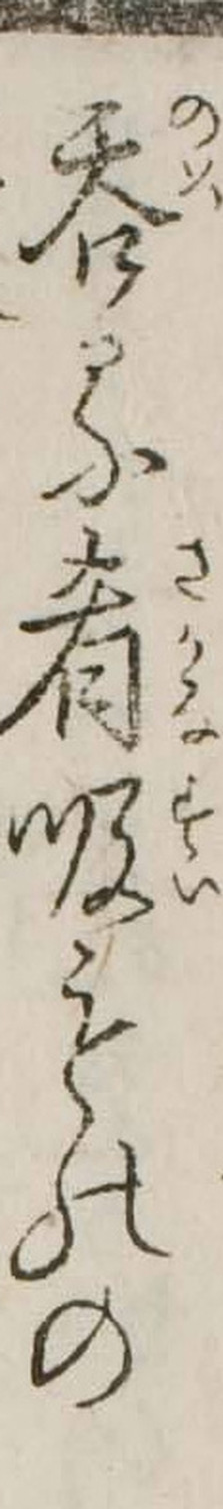呑る肴吸ものの
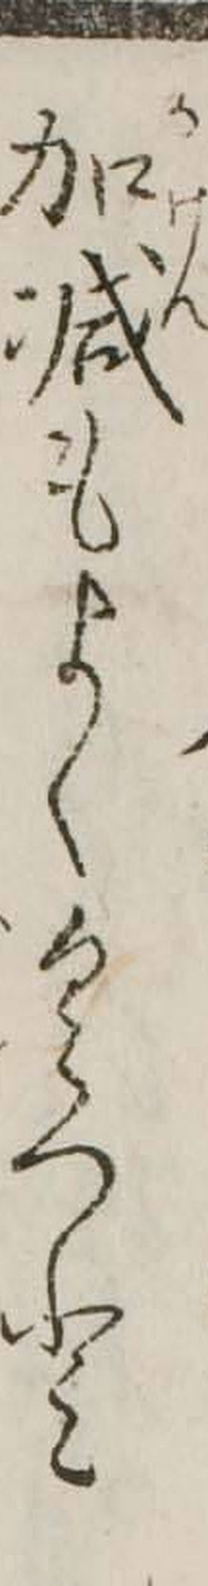加減もよくくつと
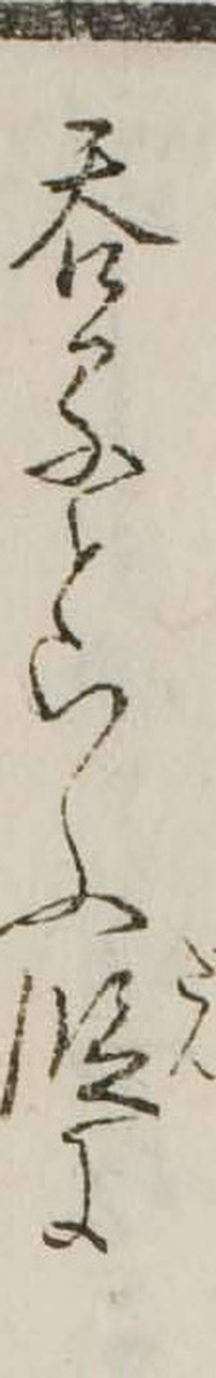呑るといふ段に
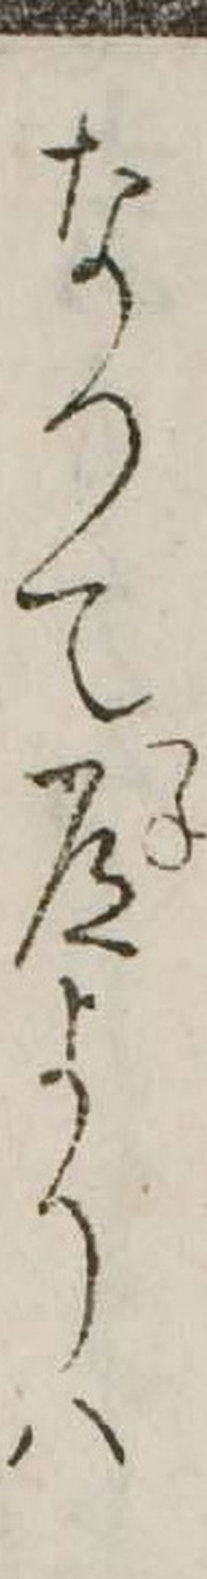なつて常よりは
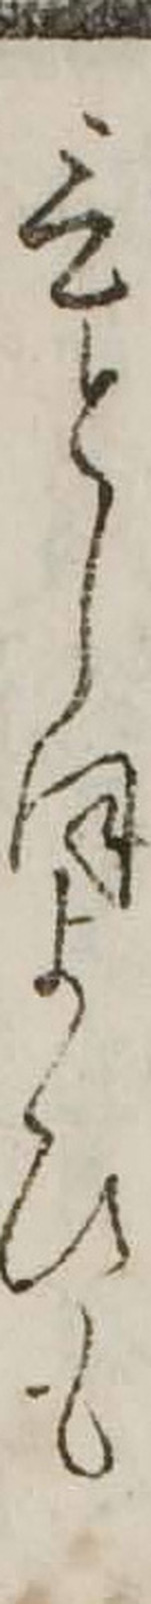ひとしほよひも
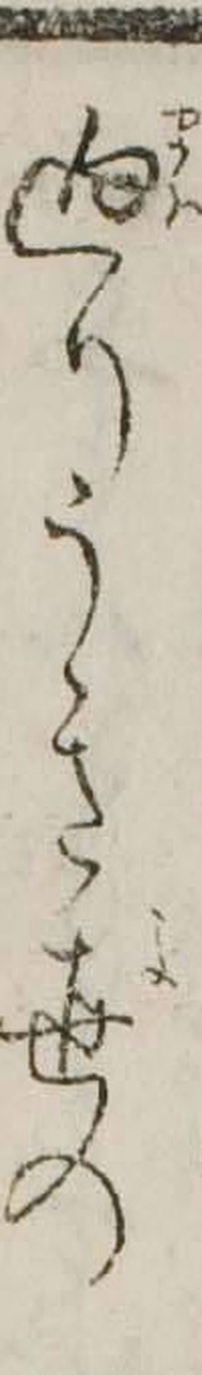廻りうき世の
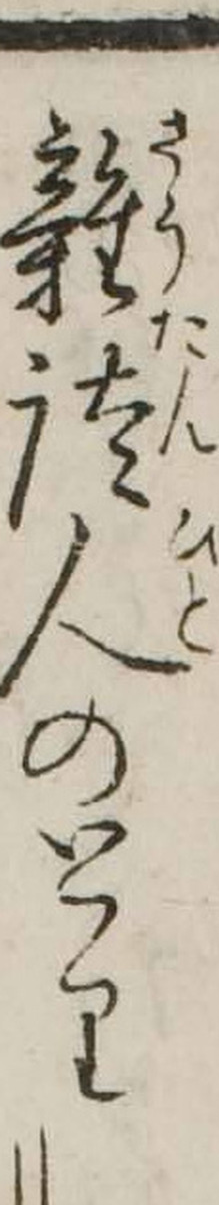雑談人のとり
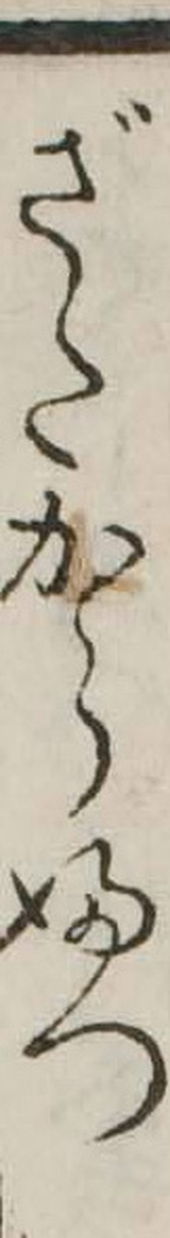ざたかうふつ
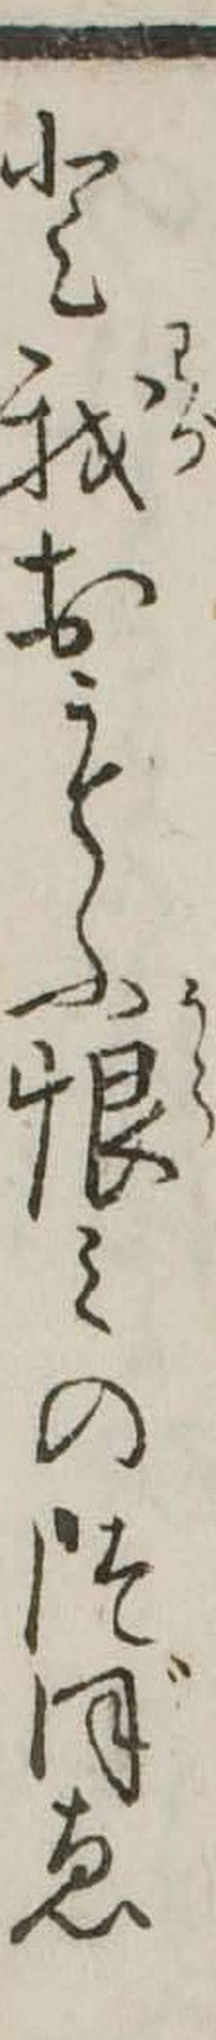と我おもふ恨みのつぼゑ
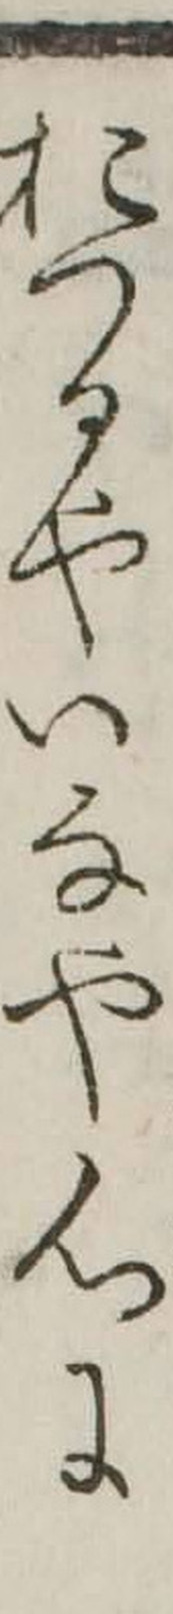おつるやいなや心に
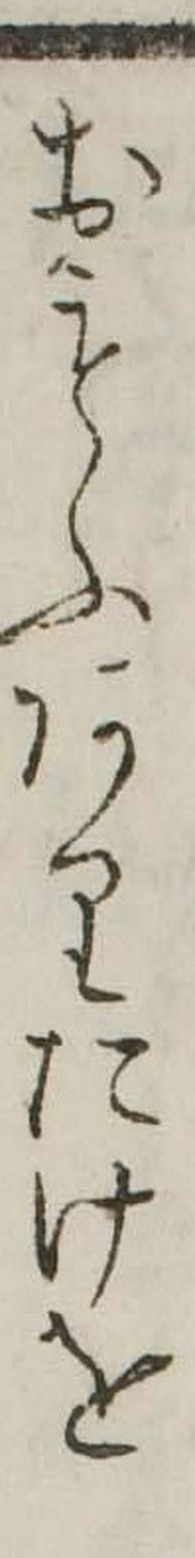おもふありたけを
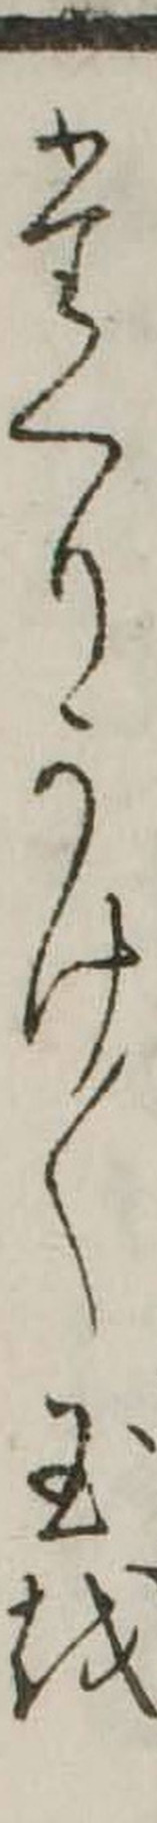たくりかけ〳〵玉を
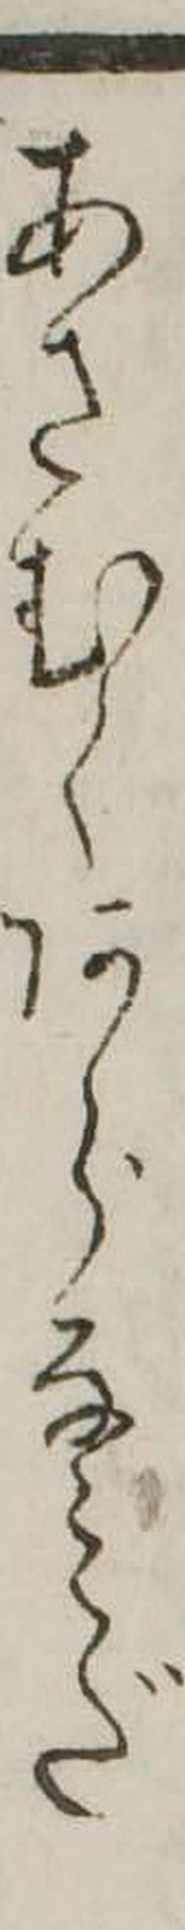あさむくあらなみだ
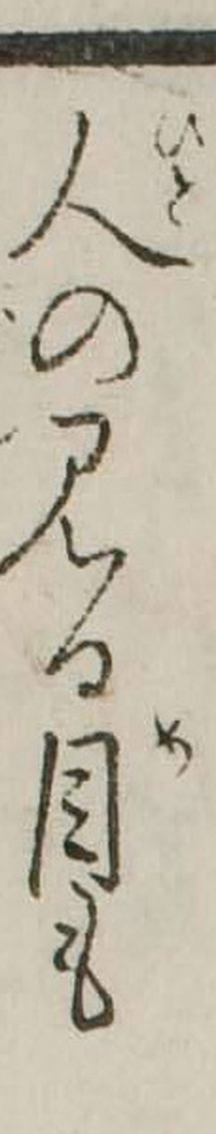人の見る目も
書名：繪本不盡泉
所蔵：国文学研究資料館
